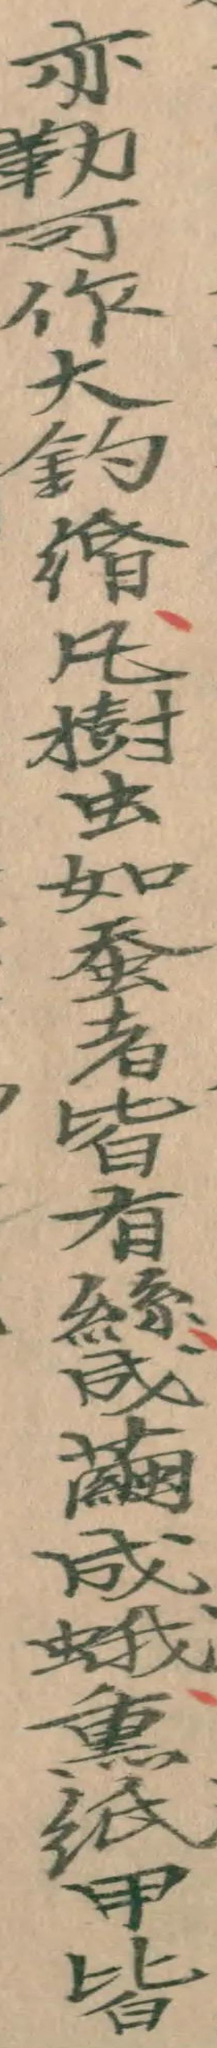亦勒可作大釣緍、凡樹虫如蚕者皆有絲、成繭成蛾、熏紙甲皆
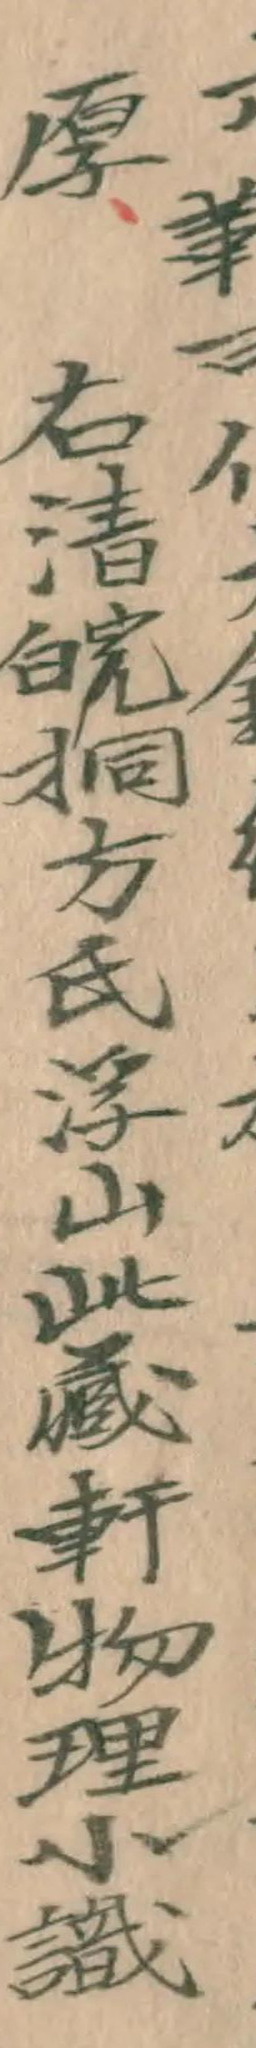厚、右清皖桐方氏浮山此藏軒物理小識
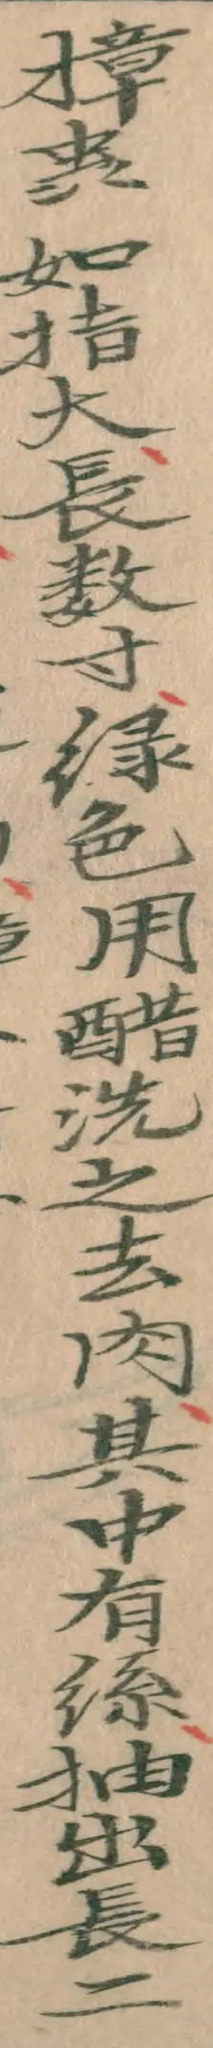樟蟲如指大、長数寸、緑色用醋洗之去肉、其中有絲、抽出長二
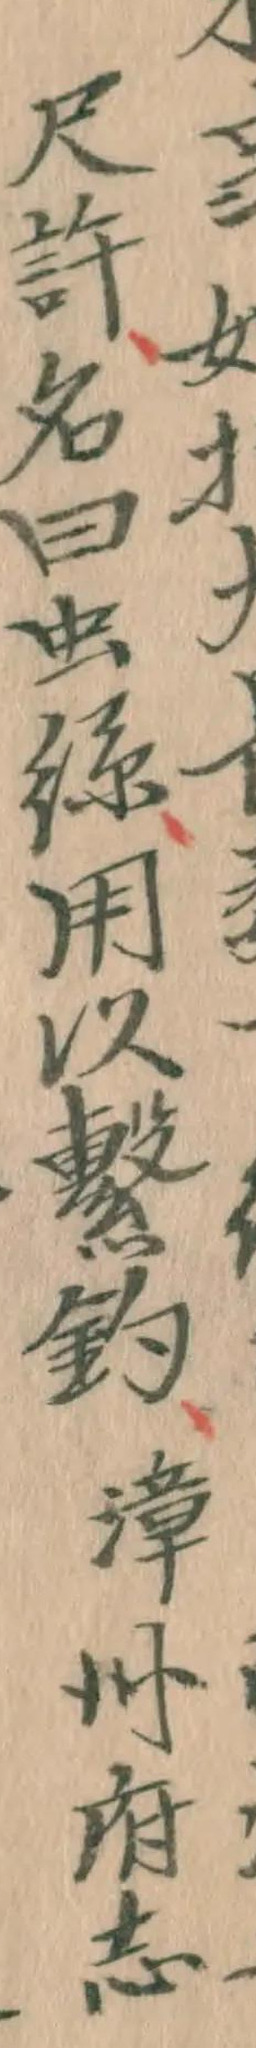尺許、名曰虫絲、用以繫釣、漳州府志
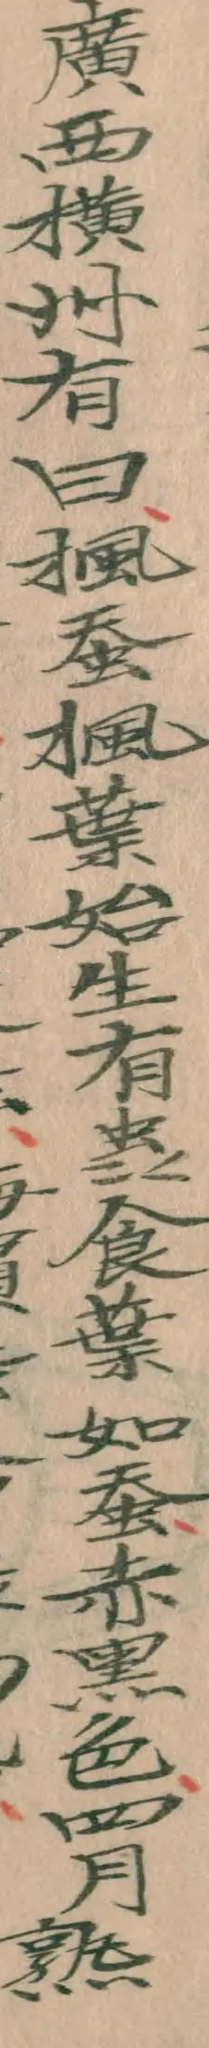廣西横州有曰、楓蚕楓葉始生有蟲食葉如蚕、赤黒色、四月熟
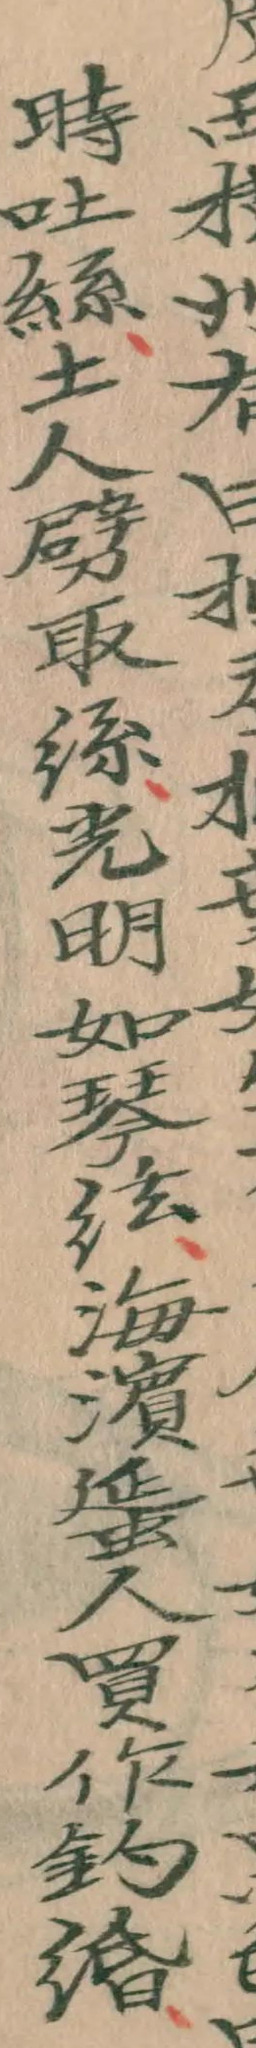時吐絲、土人劈取絲、光明如琴絃、海濵蜑人買作釣緍、
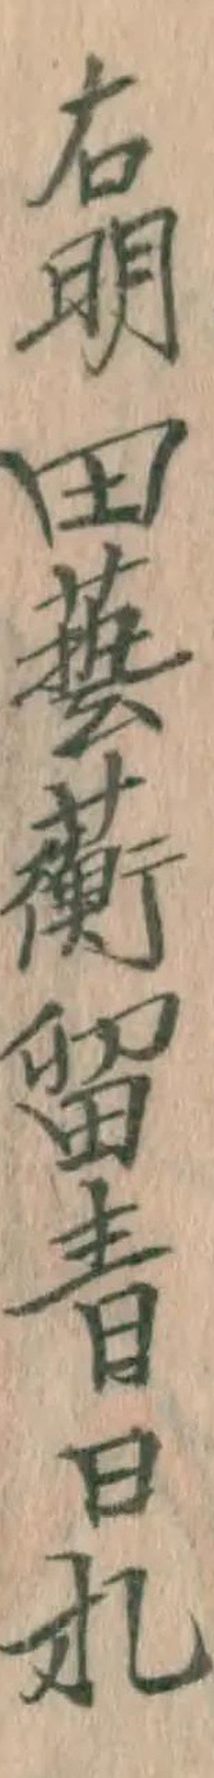右明田藝蘅留青日札
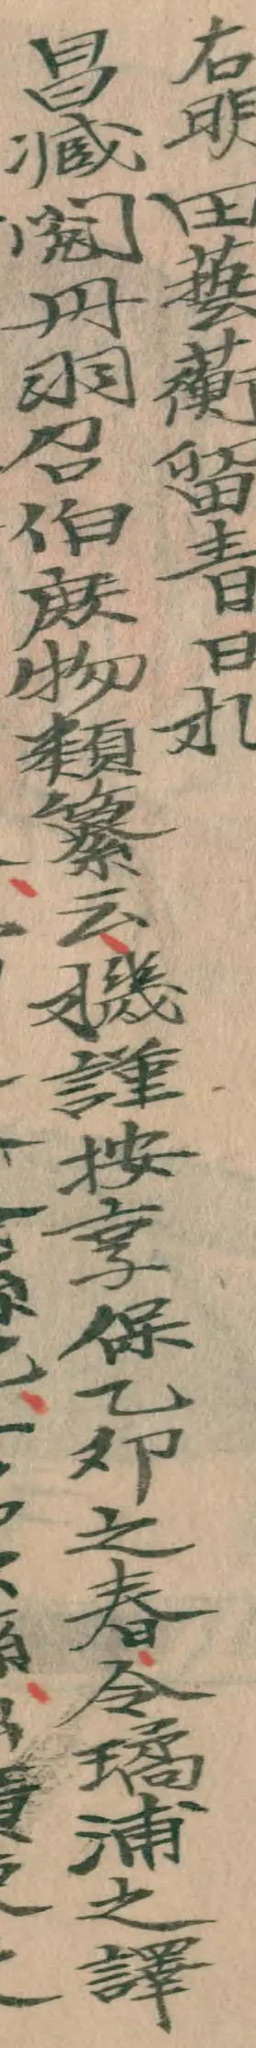昌臧開丹羽召伯庶物類纂云、機謹按享保乙卯之春、令璚浦之譯
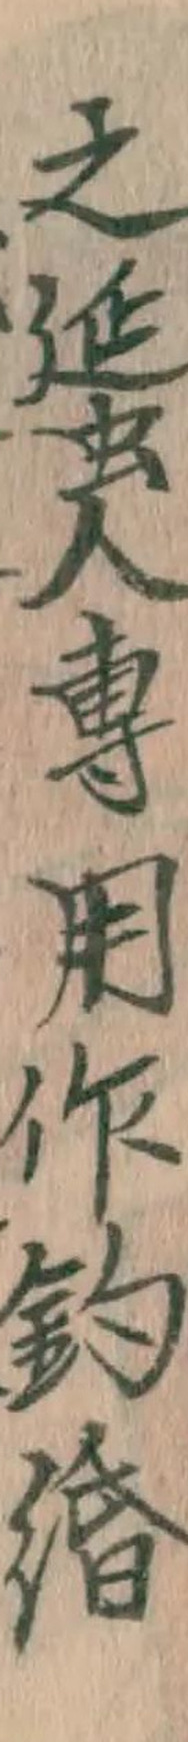之蜑人専用作釣緍
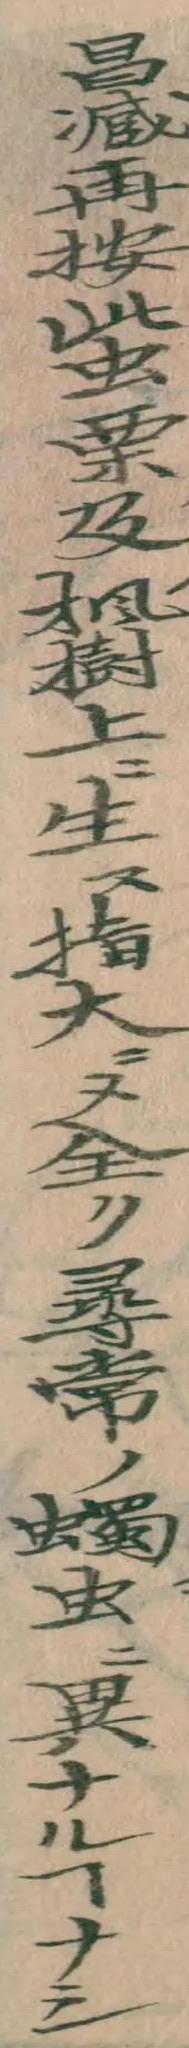昌臧再按此虫栗及楓樹上ニ生ス指大ニシテ全ク尋常ノ蠋虫ニ異ナルコトナシ
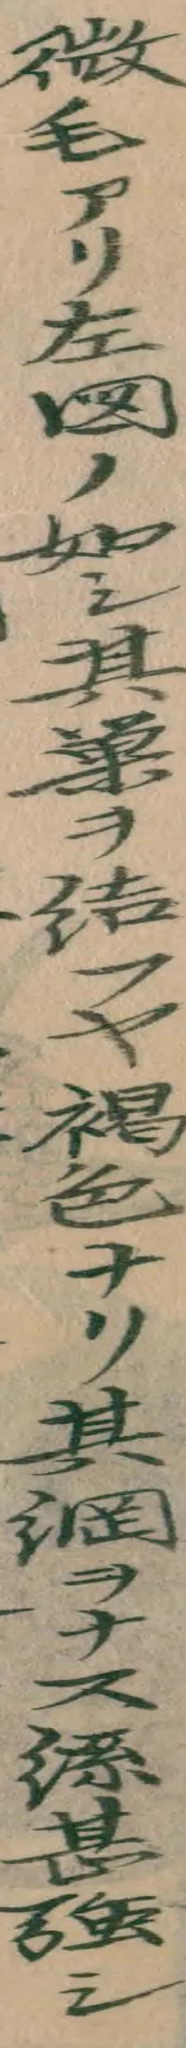微毛アリ左図ノ如シ其巣ヲ結フヤ褐色ナリ其綱ヲナス絲甚強シ
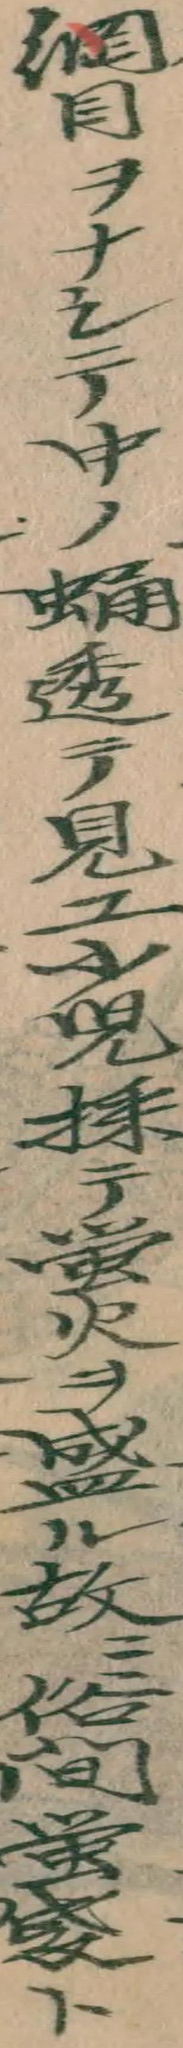綱目ヲナシテ中ノ蛹透テ見ユ小児採テ蛍火ヲ盛ル故ニ俗間蛍袋ト
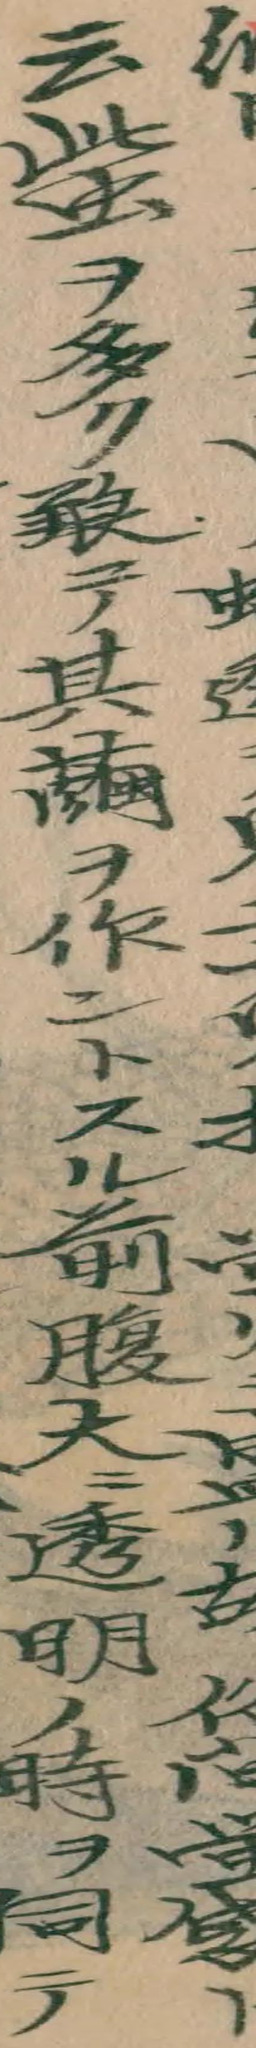云此虫ヲ多ク羪テ其繭ヲ作ントスル前腹大ニ透明ノ時ヲ伺テ
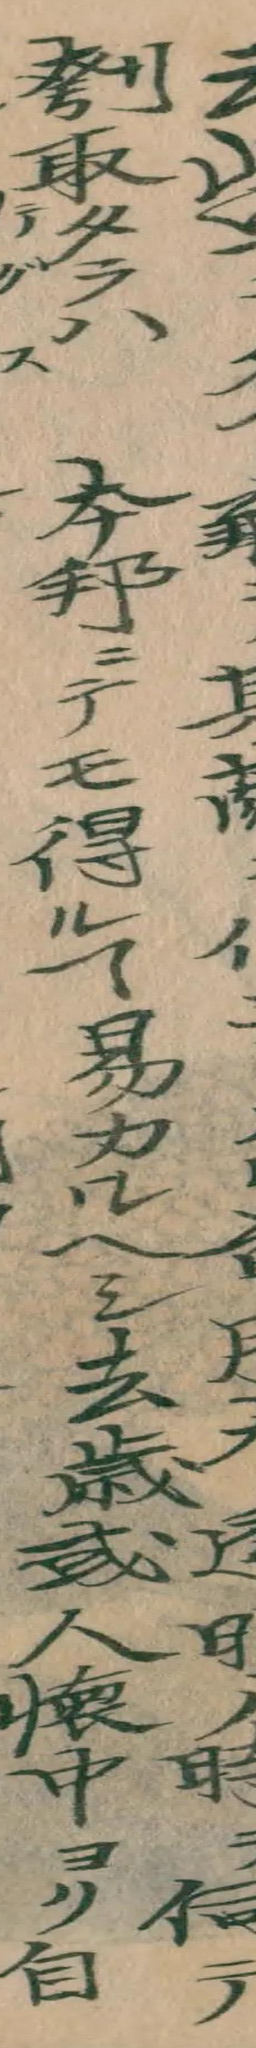剥取タラハ本邦ニテモ得ルコト易カルヘシ去歳或人懐中ヨリ自
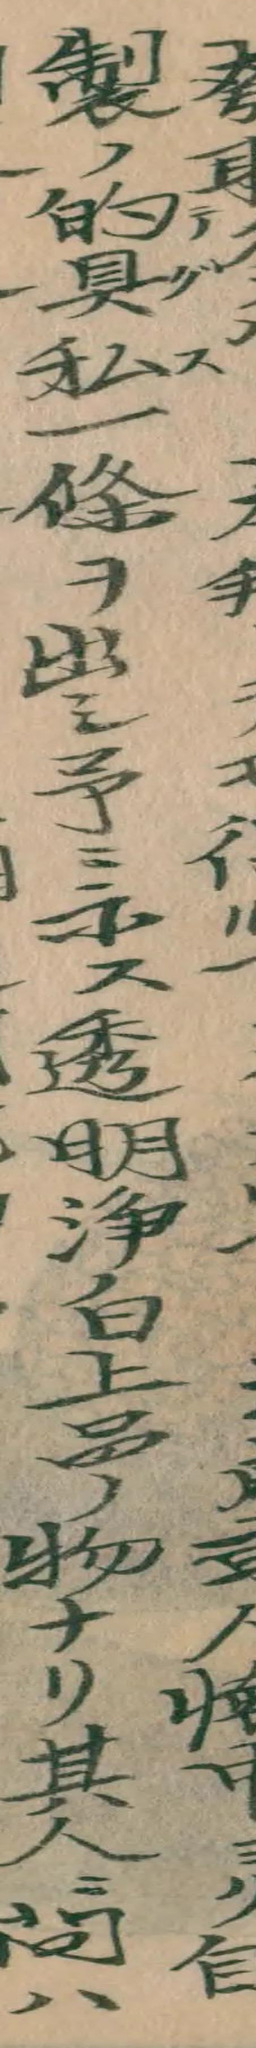製ノ的具私一條ヲ出シ予ニ示ス透明浄白上品ノ物ナリ其人ニ問ハ
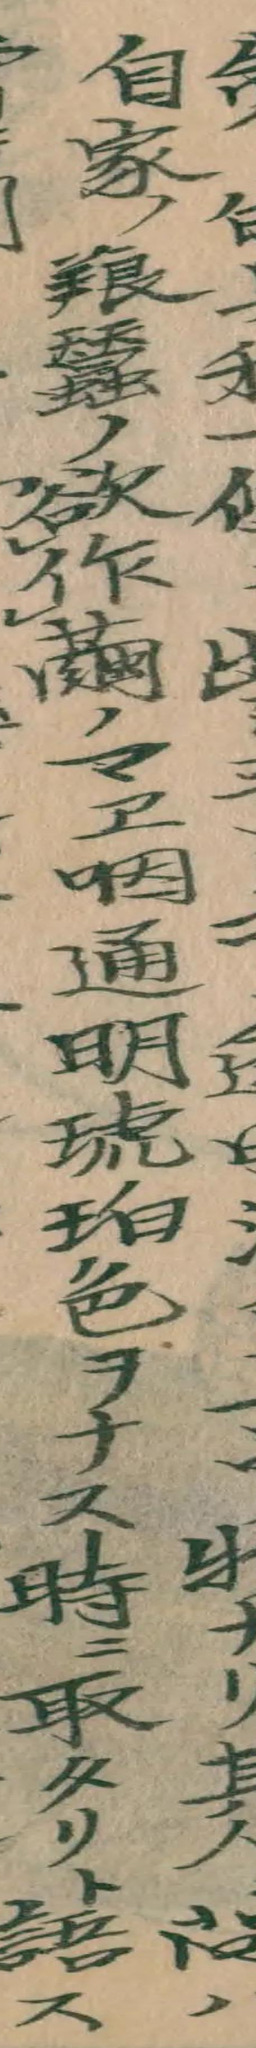自家ノ羪蠺ノ欲作繭ノマヱ咽通明琥珀色ヲナス時ニ取タリト語ス
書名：千蟲譜 3巻. [1]
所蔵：国立国会図書館 National Diet Library, JAPAN
